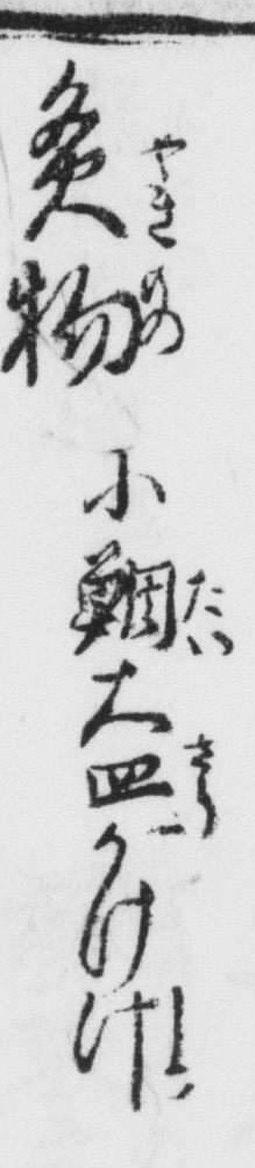灸物小鯛大皿うけ汁
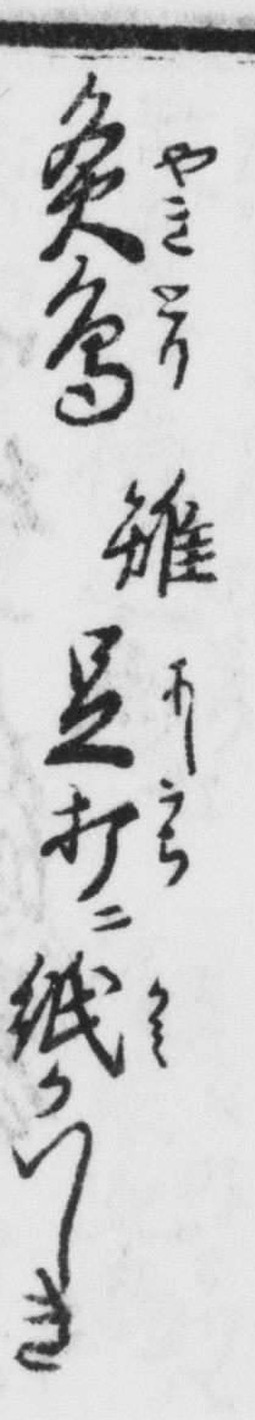灸鳥足打ニ紙かいしき
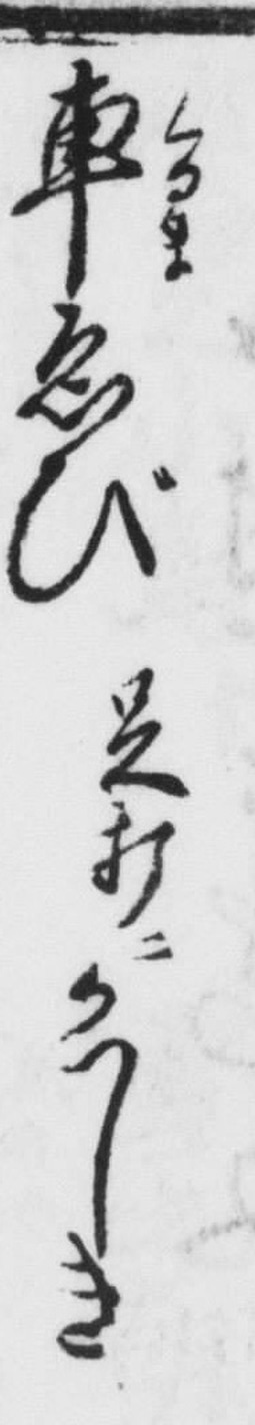車ゑび足打ニ紙かいしき
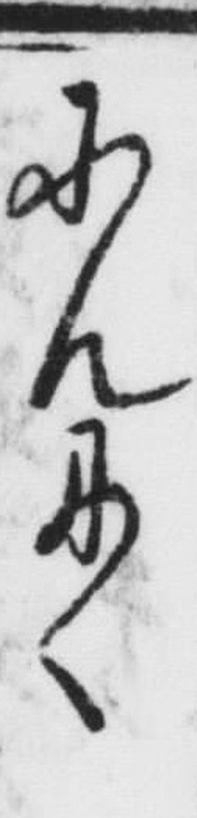にんにく
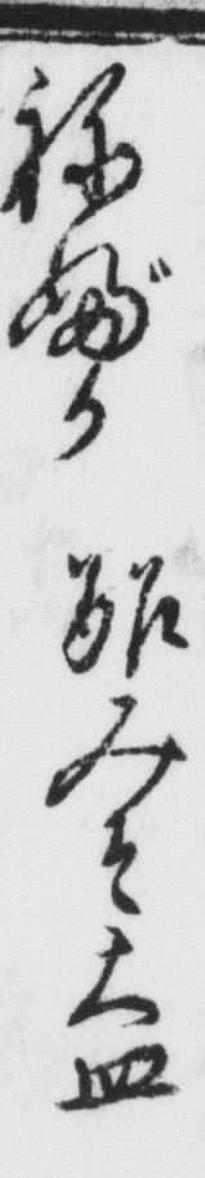ねぶか酢みそ大皿
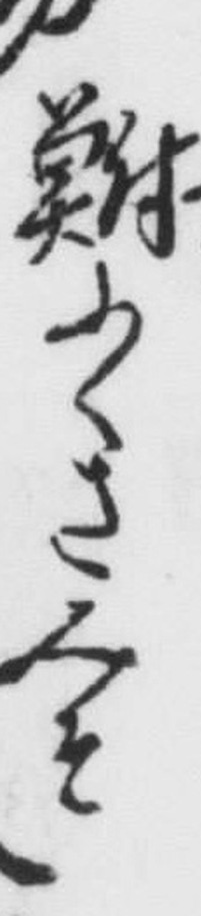鮒ふくさみそ
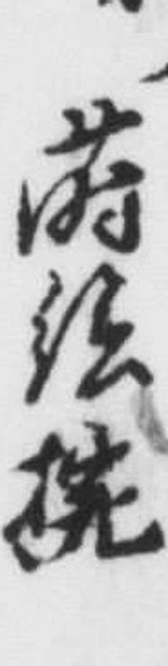蒔絵椀
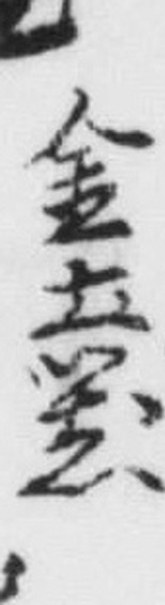金土器
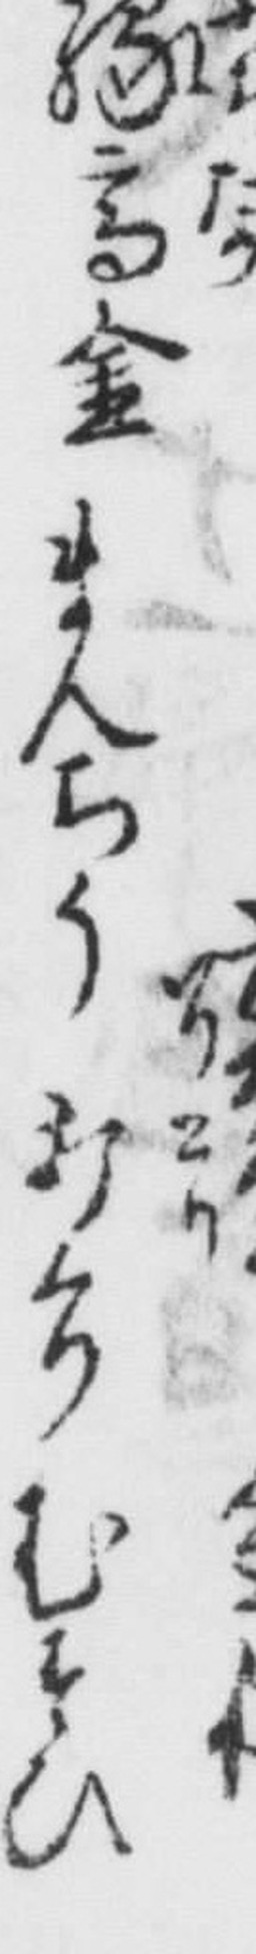縁高金まんちう打くりむすひ

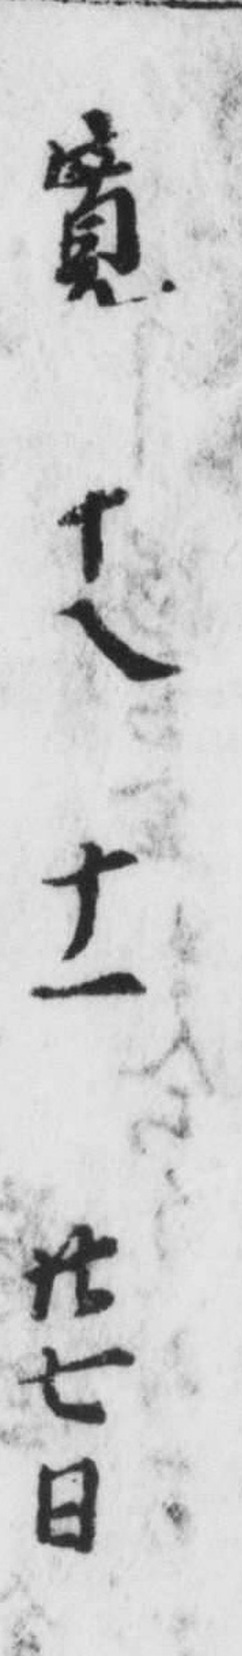寛十八十一廿七日
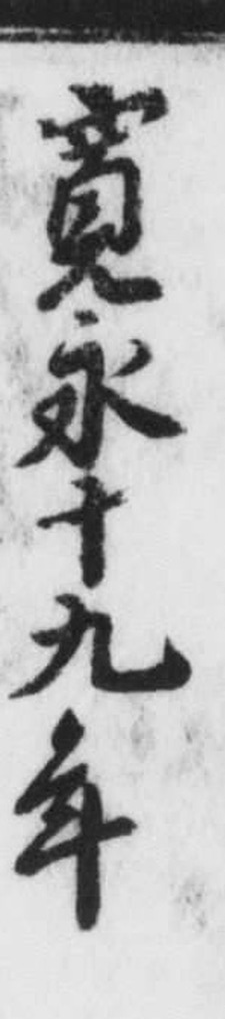寛永十九年
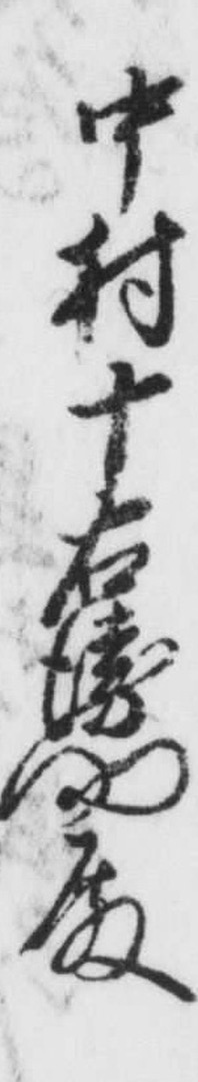中村十右衛門殿

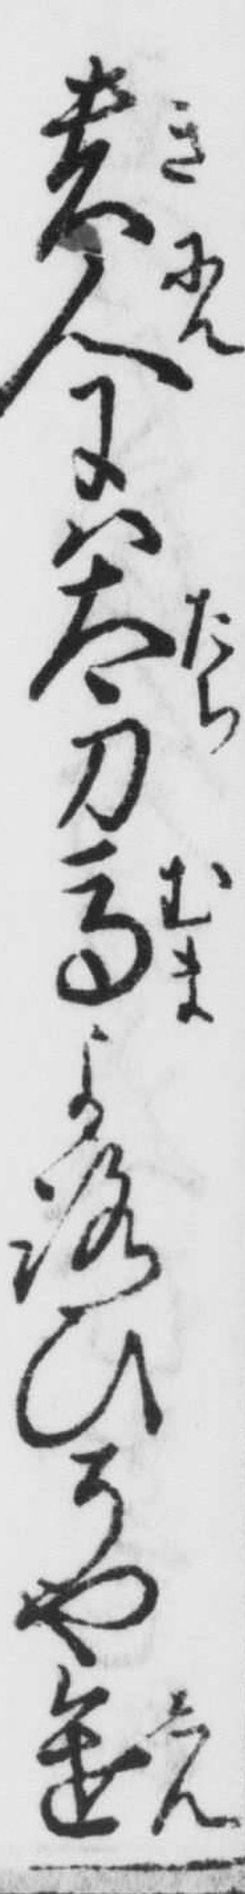貴人にハ太刀馬に洗ひかや
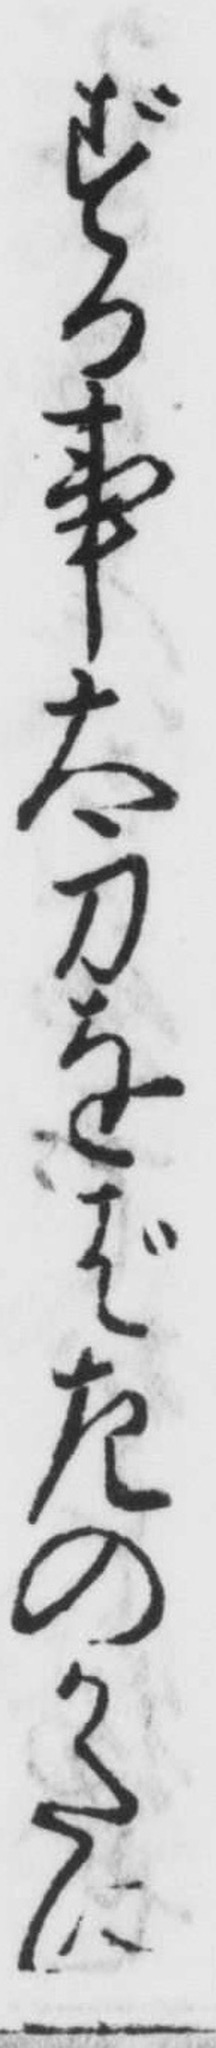ずる事太刀をばのかたに
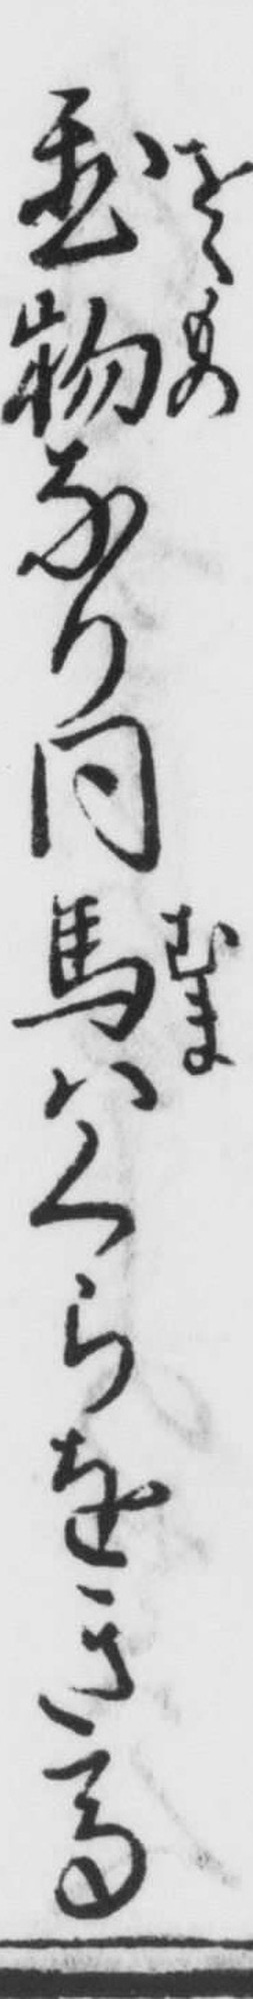置物なり同馬ハくらをき
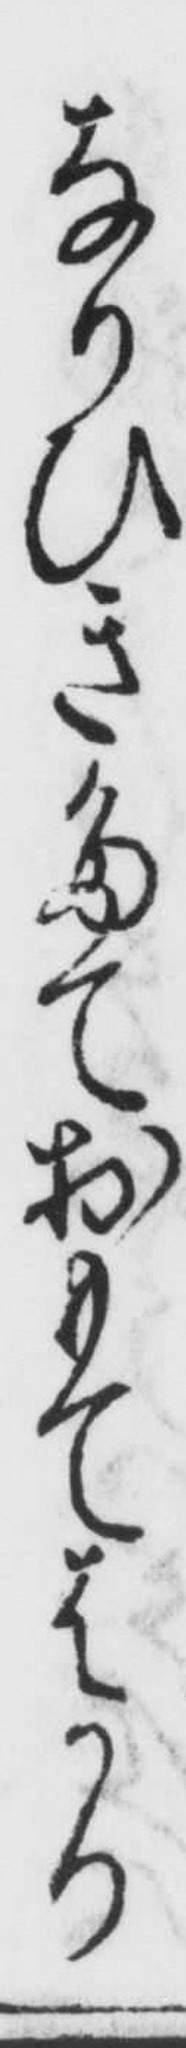なりひきておもてはかり
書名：料理切形秘伝抄
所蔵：大阪府立大学学術情報センター 国文学研究資料館
